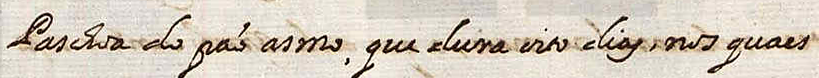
Paschoa do paõ asmo, que dura oito dias, nos quaes
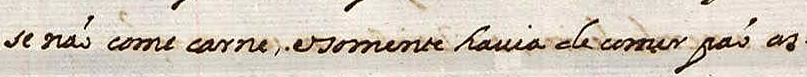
se naõ come carne,. e somente hauia de comer paõ as
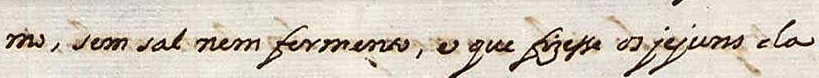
mo, sem sal nem fermento, e que fizesse os jejuns da
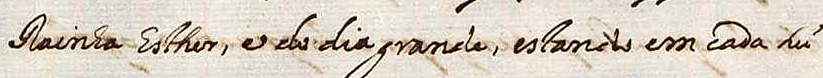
Rainha Esther, e do dia grande, estando em cada hū
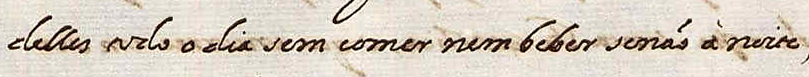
delles todo o dia sem comer nem beber senaõ à noite,
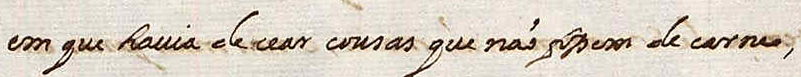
em que hauia de cear cousas que naõ fossem de carne,
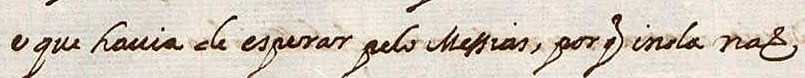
e que hauia de esperar pelo Messias, porq̄ inda naõ
